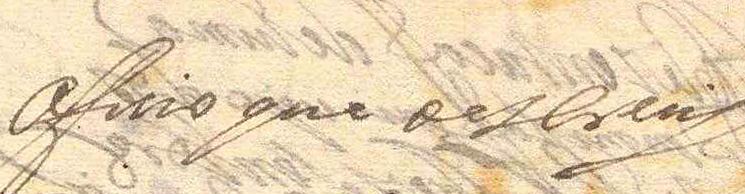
Officio que o escreuj
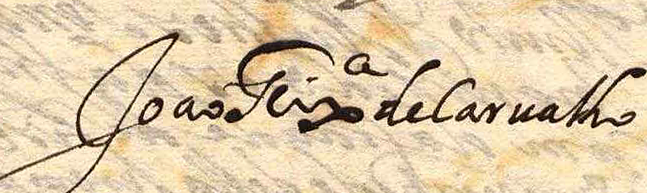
Joaõ Teix.a de Carualho
